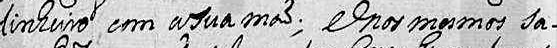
dinheiro com a sua maõ; e nos mesmos sa
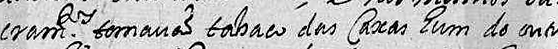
cram.tos tomauaõ tabaco das Caxas hum do outro,
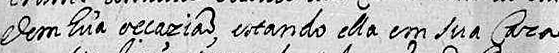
e em hūa occaziaõ, estando ella em sua Caza
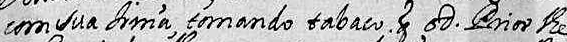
com sua Irmã, tomando tabaco q̄ o d. Prior lhe
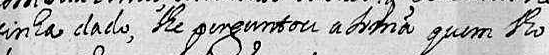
tinha dado, lhe perguntou a Irmã quem lho
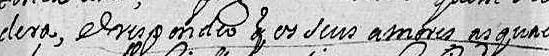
dera, e respondeo q̄ os seus amores as quaes
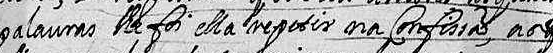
palauras lhe foi ella repetir na Confissaõ, ao q̄
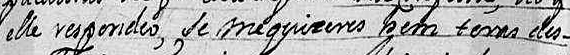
elle respondeo, se me quizeres bem teras des
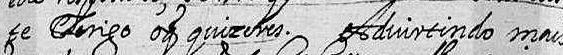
te clerigo o q̄ quizeres. Aduirtindo mais
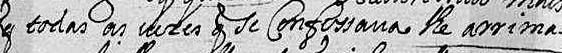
q̄ todas as uezes q̄ se Confessaua lhe arrima
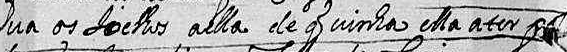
ua os Ioelhos a ella de q̄ uinha ella a ter pol
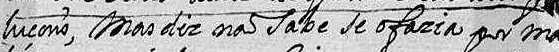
luçons̄, mas diz naõ sabe se o fazia por ma
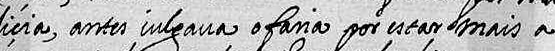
licia, antes iulgaua o faria por estar mais a
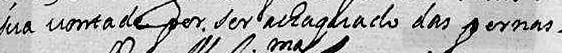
sua uontade por ser achaquado das pernas.
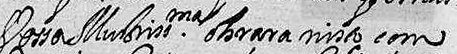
Vossa Illustriss.ma obrara nisto com
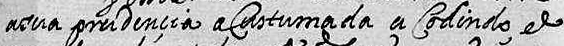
a sua prudencia aCustumada aCodindo, e o
